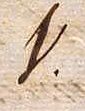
1.
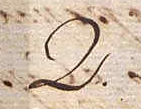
2.
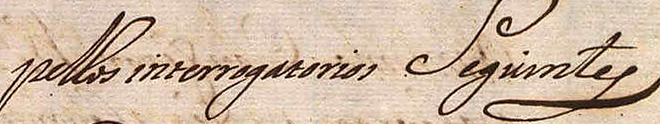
pellos interrogatorios Seguintes
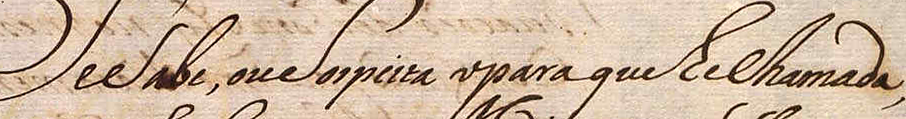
Se Sabe, ou Sospeita o para que he chamada
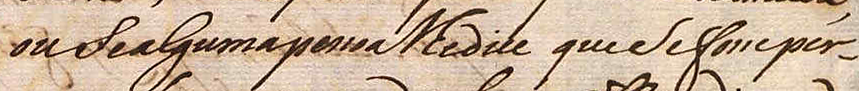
ou se alguma pessoa lhe dice que se fosse per
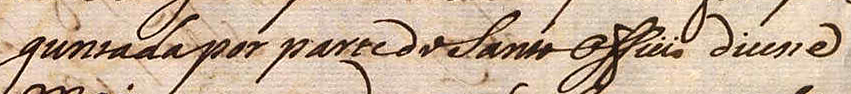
guntada por parte do santo officio dicesse
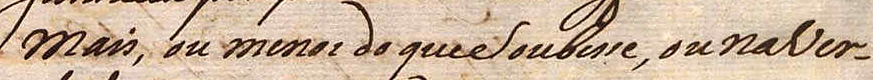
mais, ou menos do que soubesse, ou na Ver
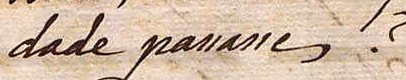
dade passasse?
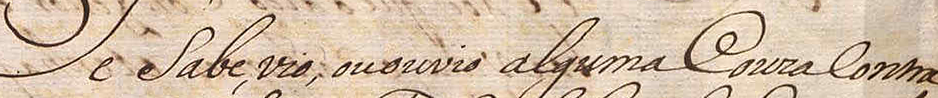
Se Sabe, vio, ou ouvio alguma Couza Contra
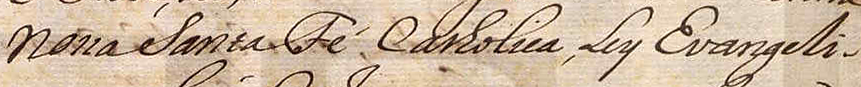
nossa Santa Fé Catholica, Ley Evangeli
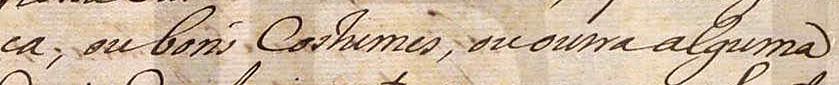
ca, ou bons Costumes, ou outra alguma
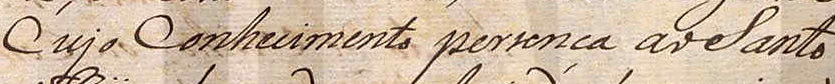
Cujo Conhecimento pertença ao Santo
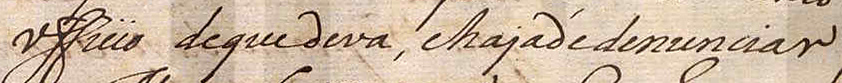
officio de que deva, e haja de denunciar
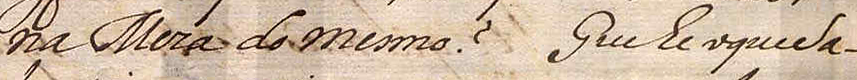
na Meza do mesmo? Que he o que Sa
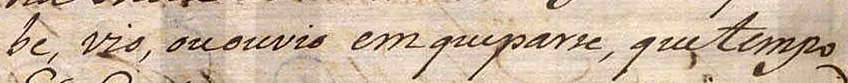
be, vio, ou ouvio em que parte, que tempo
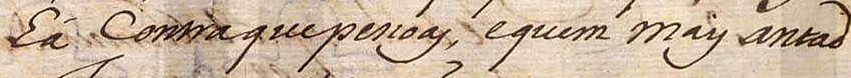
há Contra que pessoas, e quem mais antaõ
